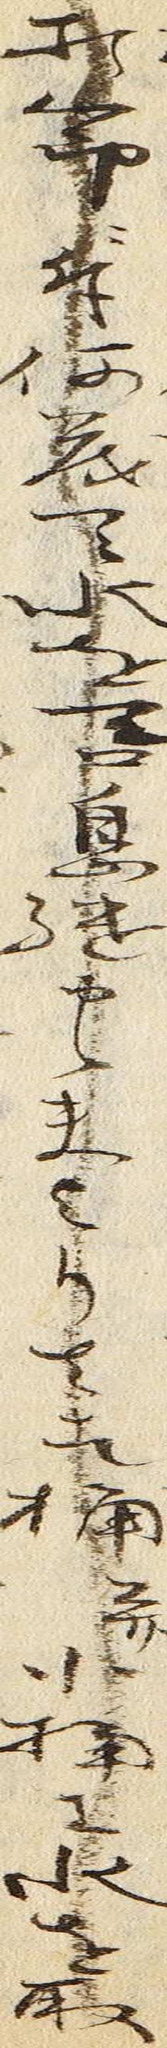折節に付何も天水を呑息継申候夫よりはす桶并小桶に水を取
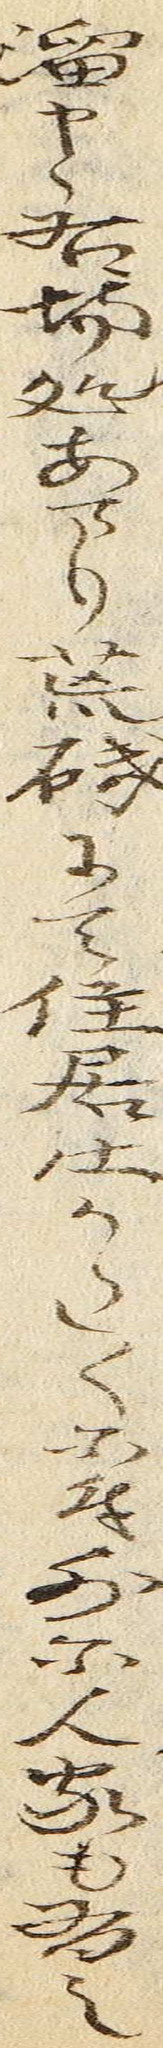溜申候右場処あまり荒磯にて住居仕かたくに付外に人家も有之
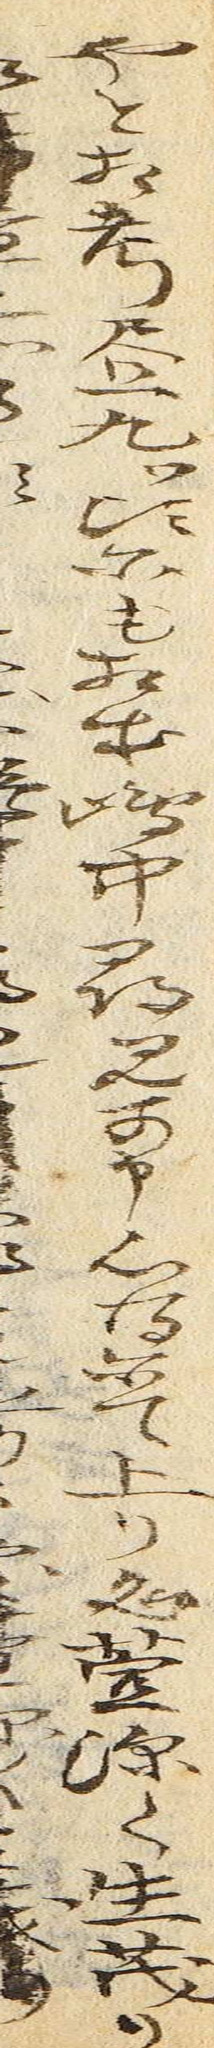やと相考昼九ツ頃にも相成嶋中尋見可申心得にて上り処萱深く生茂り
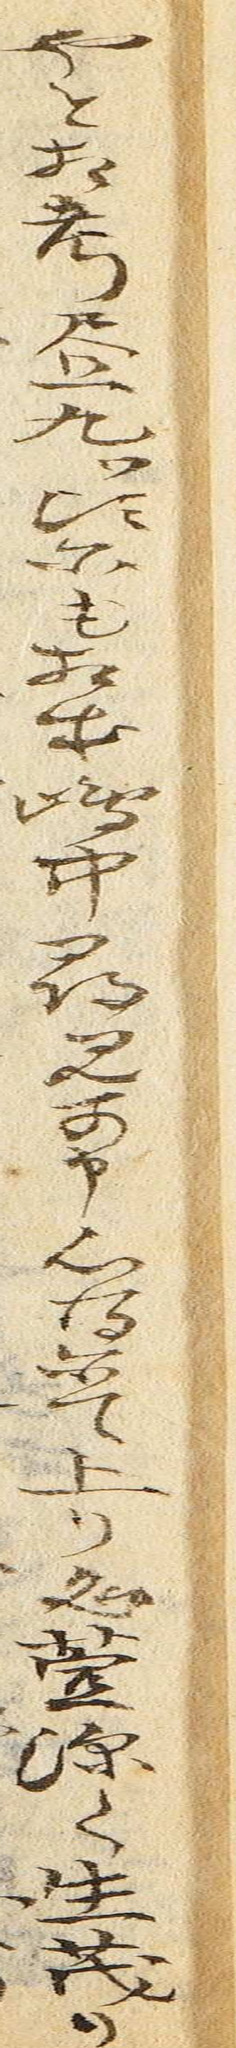やと相考昼九ツ頃にも相成嶋中尋見可申心得にて上り処萱深く生茂り
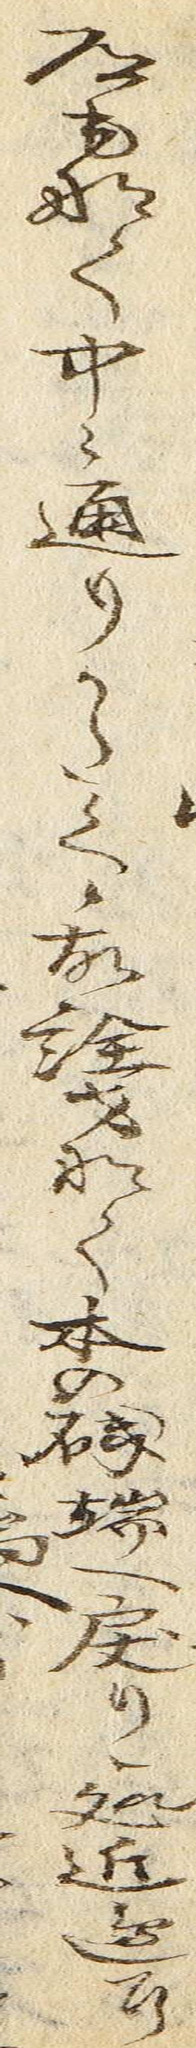道もなく中々通りかたく候故詮方なく本の磯端へ戻り候処近辺に
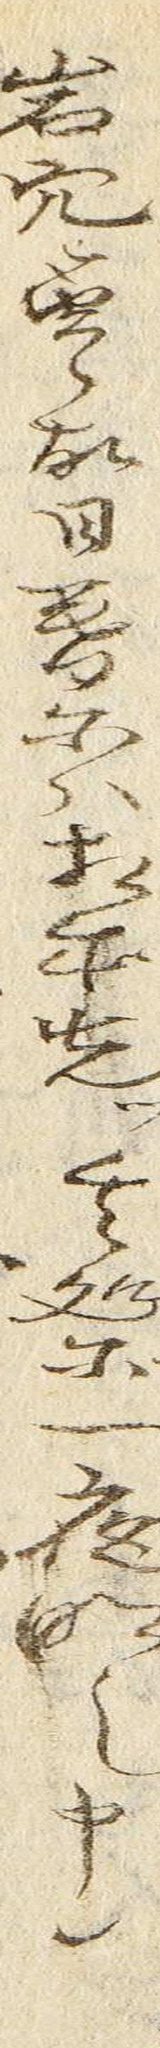岩穴御座候故日暮にハ相成先ツ其処に一夜明し申候
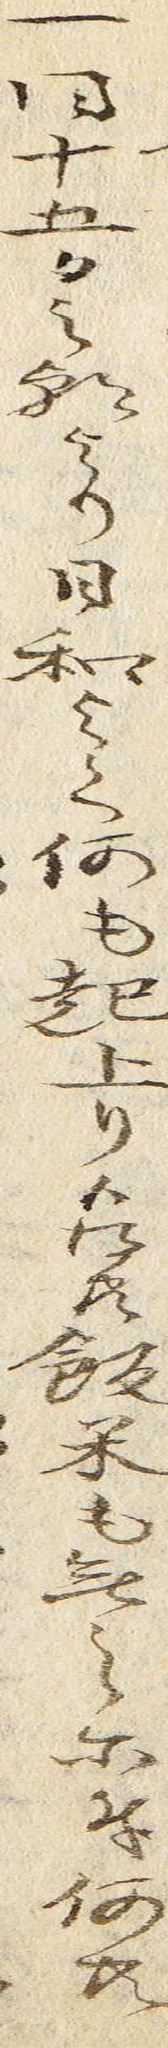一同十五日之朝より日和よく何も起上り候得共飯米も無之に付何共
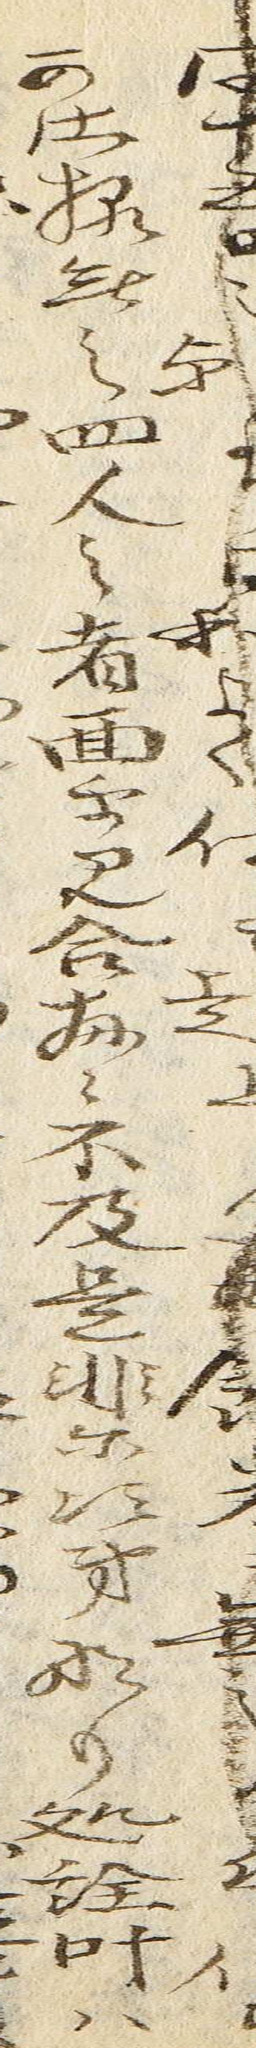可仕様無之四人之者面を見合扨々不及是非に次第なり処詮叶ハ
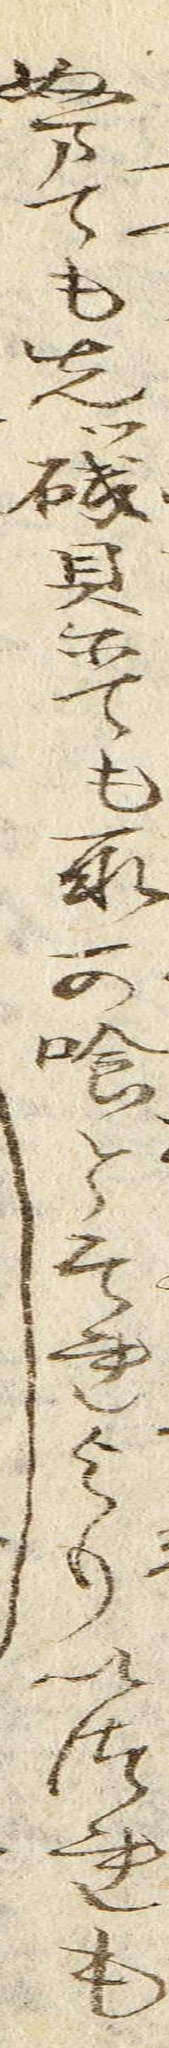ぬまても先ツ礒貝にても取可喰それよりいつれも
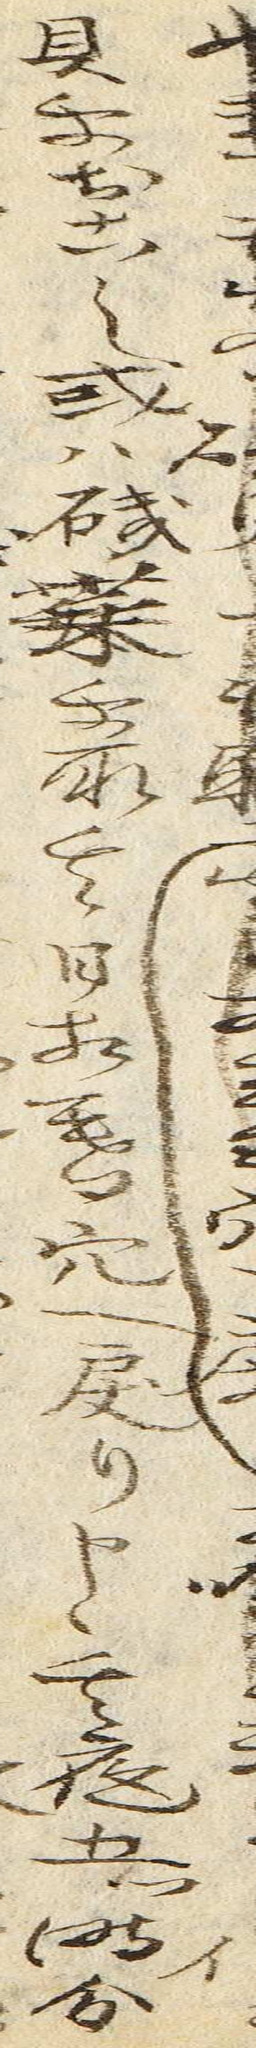貝をおこし或ハ磯菜を取其日相暮穴へ戻り申候其夜五ツ時分
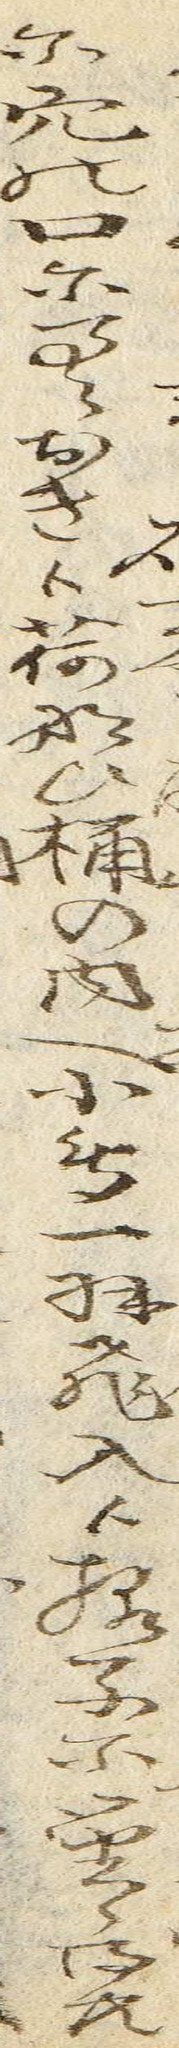に穴の口に差おき候荷なひ桶の内へ小鳥一羽飛入候様子に御座候得共
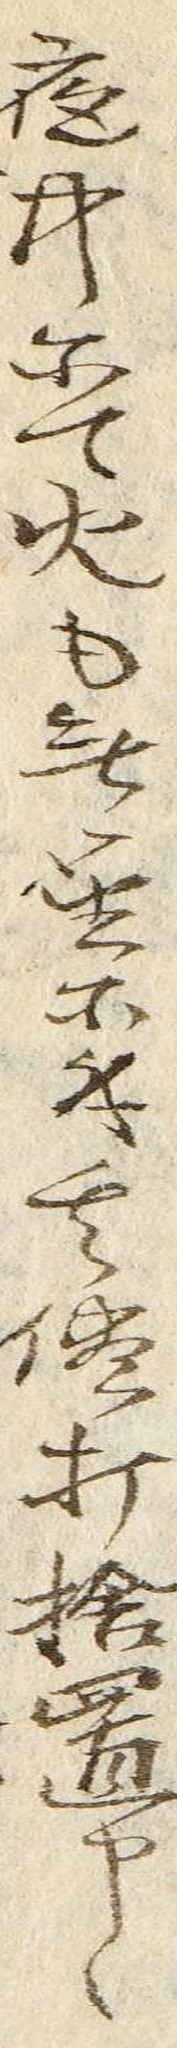夜中にて火も無御座に付其儘打捨置申候
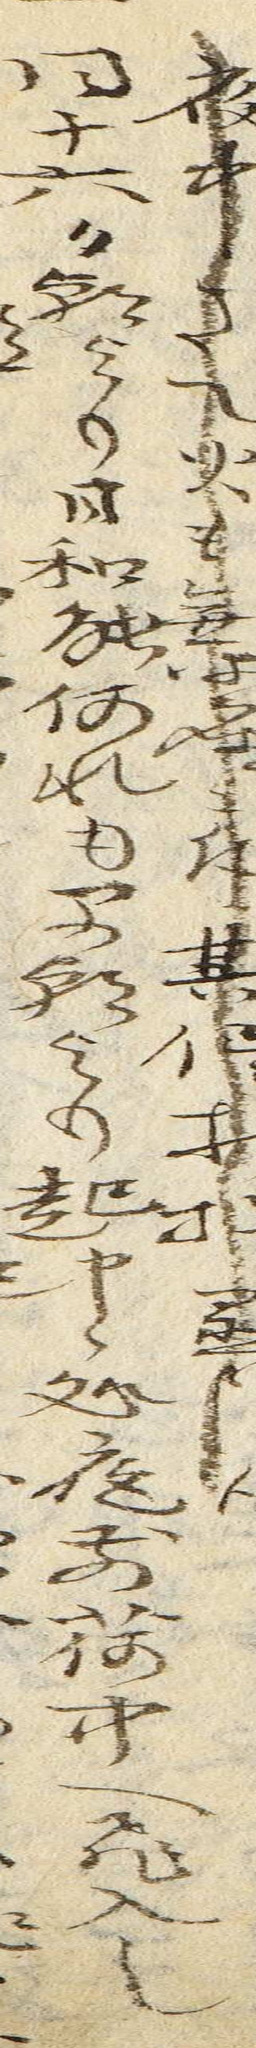一同十六日朝より日和能何れも早朝より起申候処夜前荷中へ飛入し
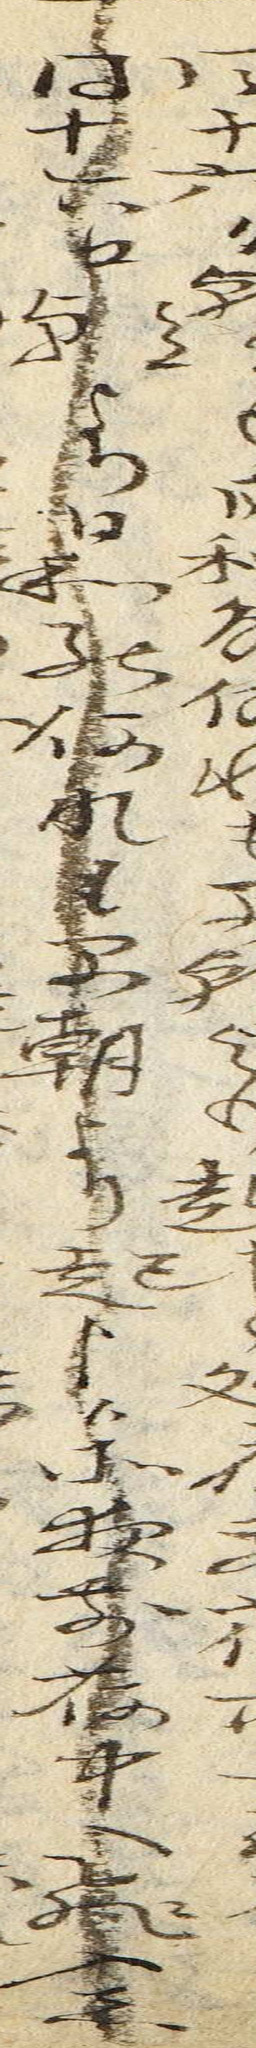一同十六日朝より日和能何れも早朝より起申候処夜前荷中へ飛入し
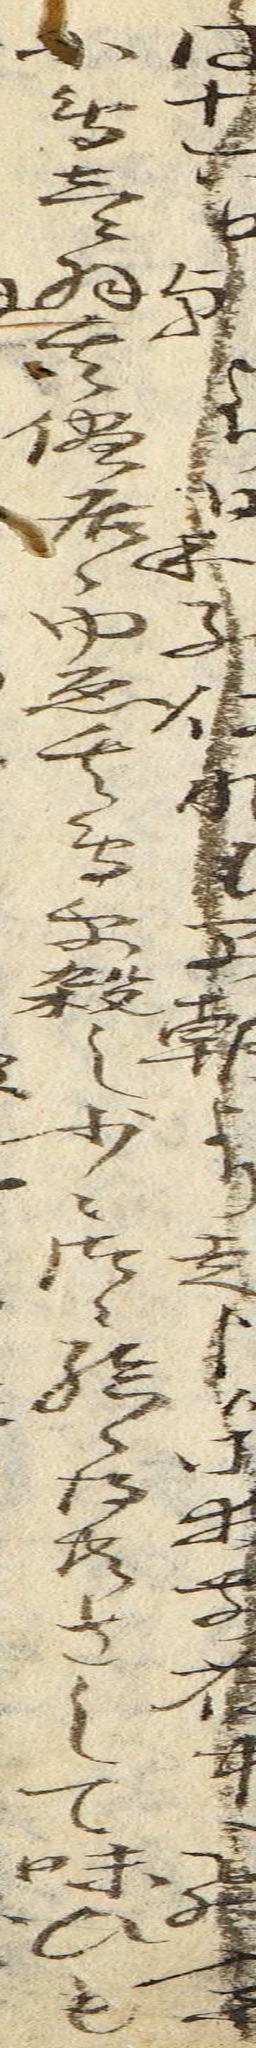小鳥壱羽其儘居候ゆゑ其鳥を殺し少々つゝ給候得共さして味ひも

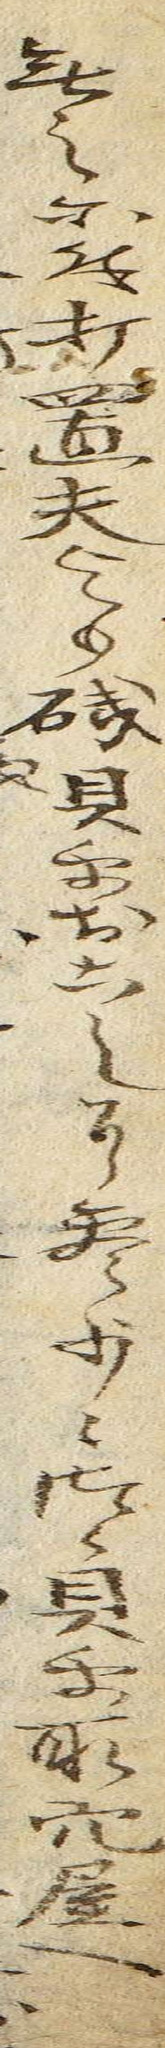無之に付打置夫より礒貝をおこしに参候少々つゝ貝を取穴屋へ
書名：無人島漂流書付
